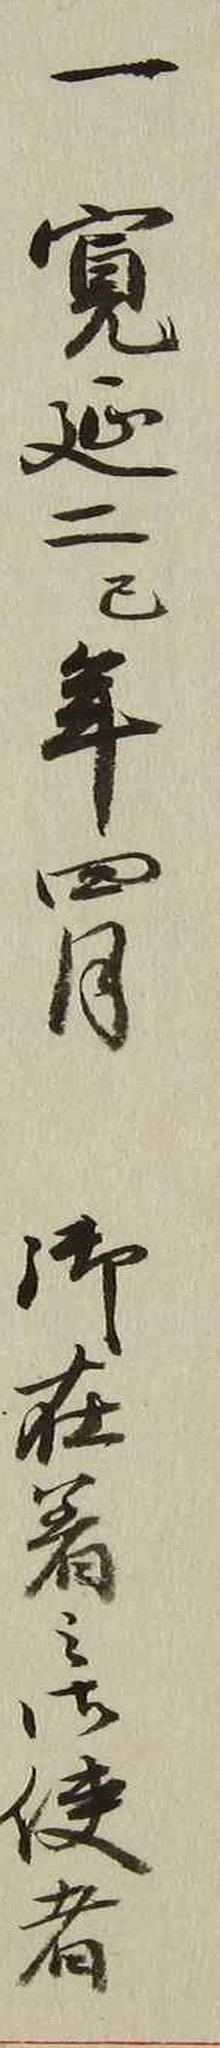一寛延二年巳四月御在着之御使者
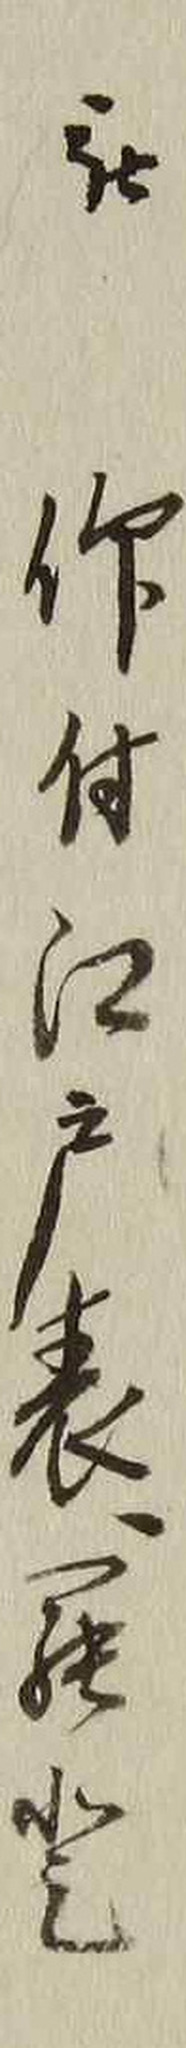被仰付江戸表へ罷登
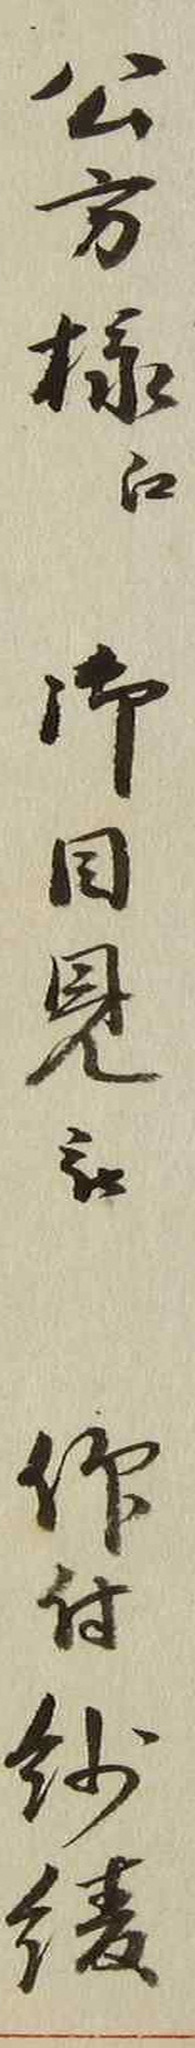公方様江被御目見被仰付紗綾
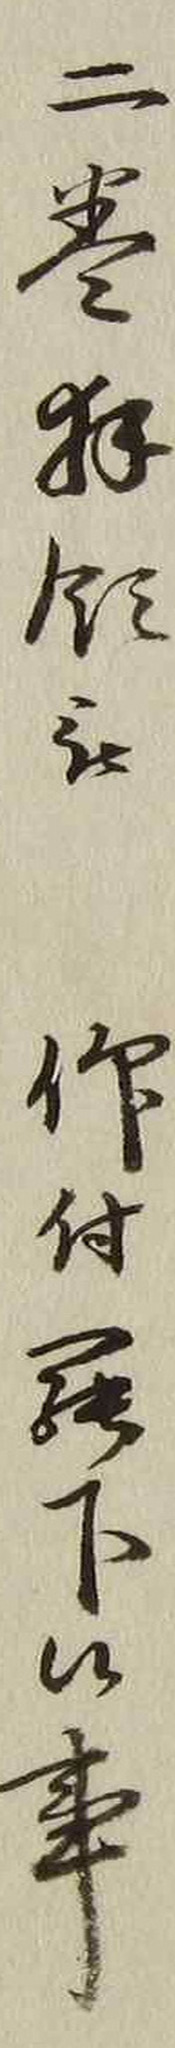二巻拝拝領被仰付罷下候事
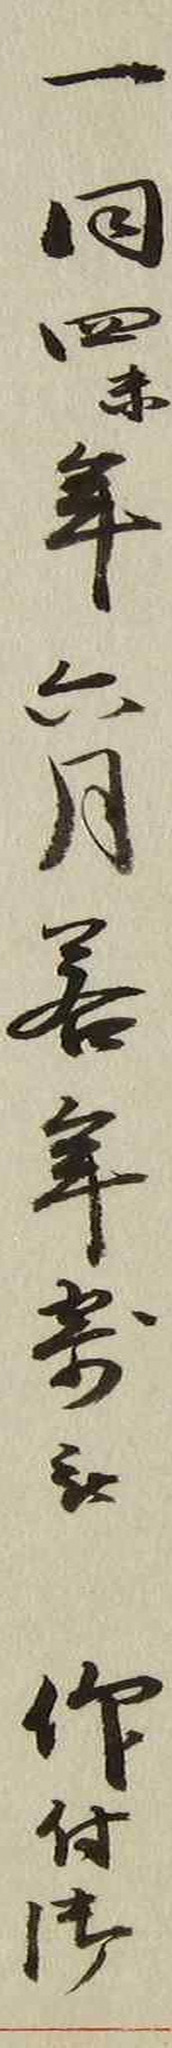一同四末年六月若年寄被仰付御
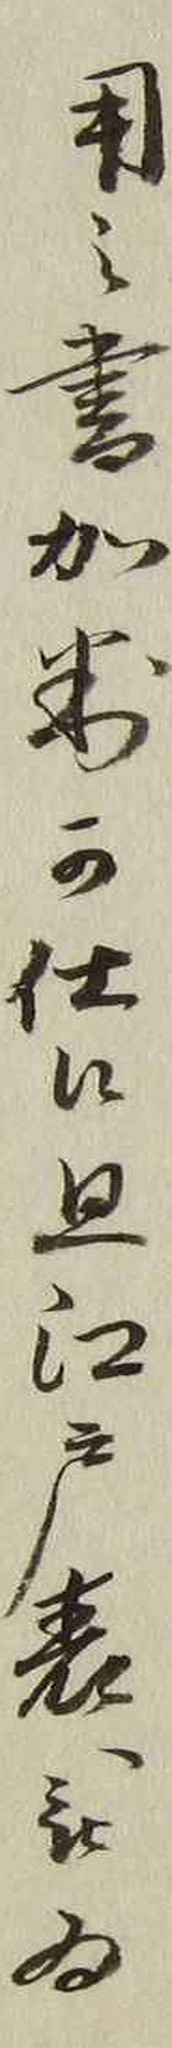用之書加判可仕候且江戸表へ被為
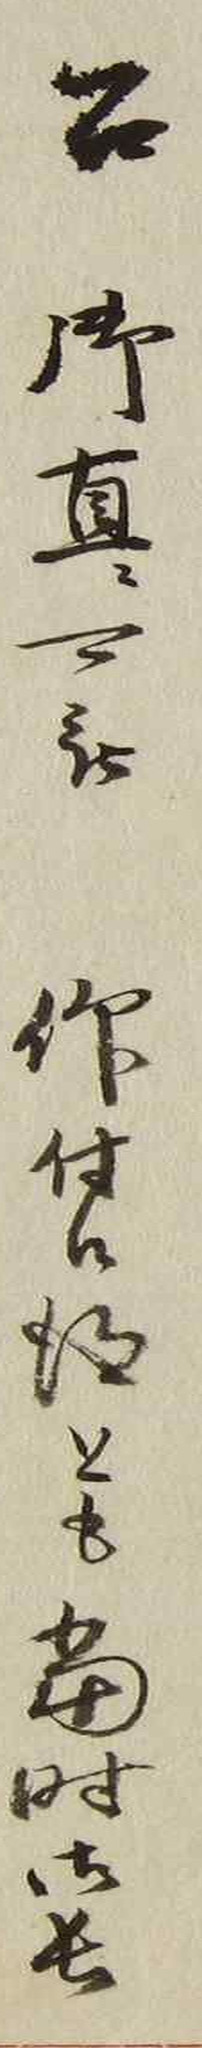召御直に可被仰付候得とも当時御長
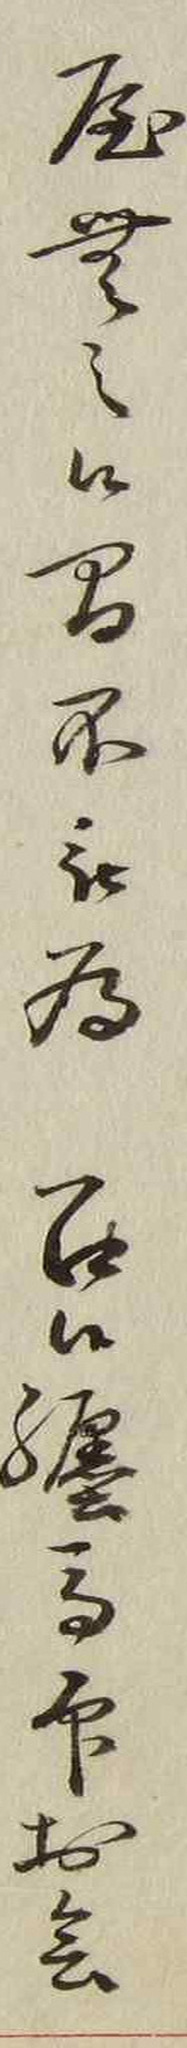屋無之候間不被為召候蟹馬印於会
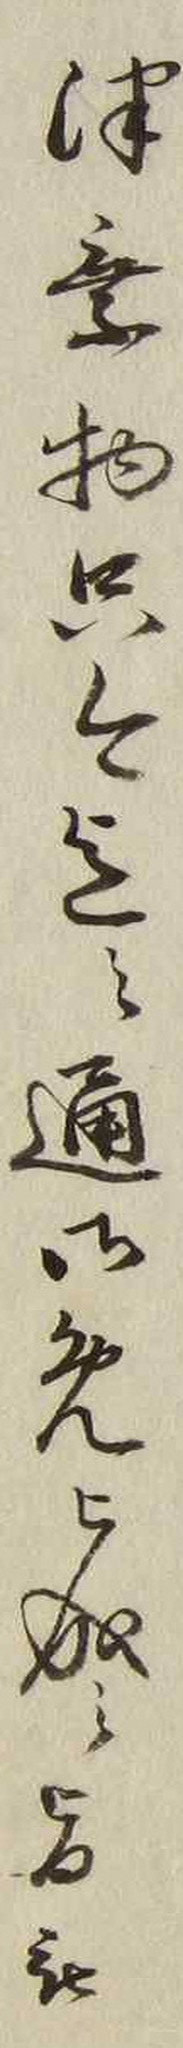津乗物只今迄之通御免被成之旨被
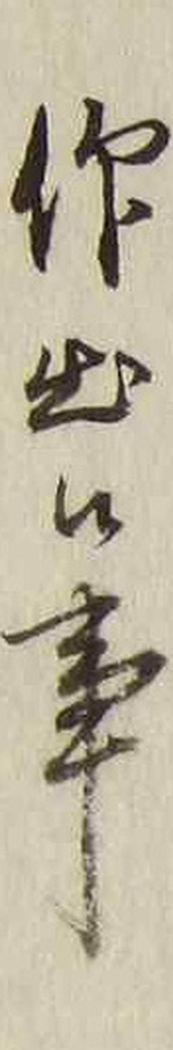仰出候事

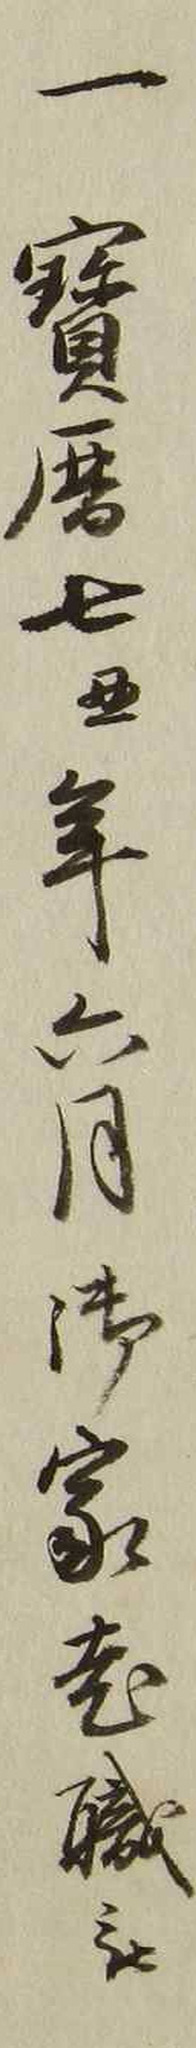一宝暦七丑年六月御家老職被
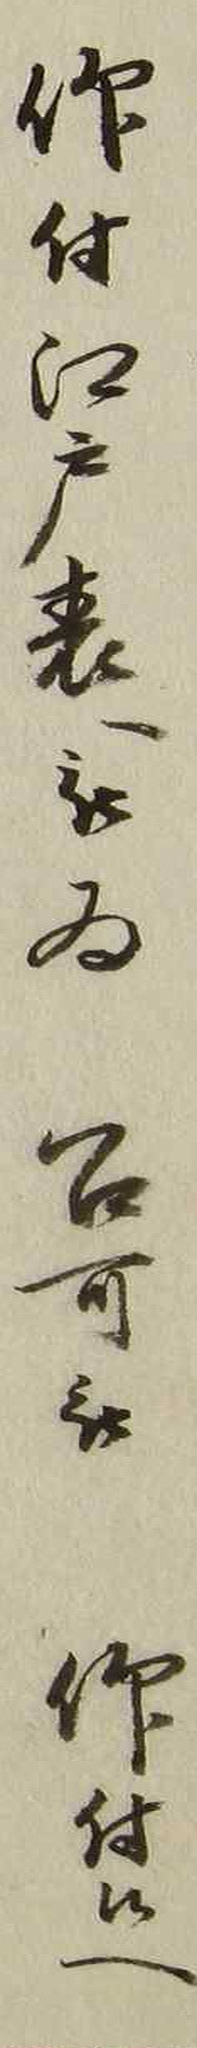仰付江戸表へ被為召可被仰付候へ
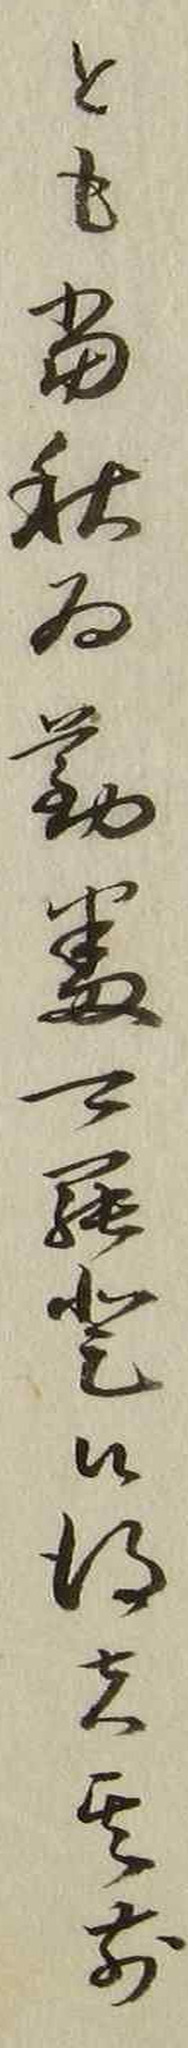とも当秋為勤番可罷登候得は其前
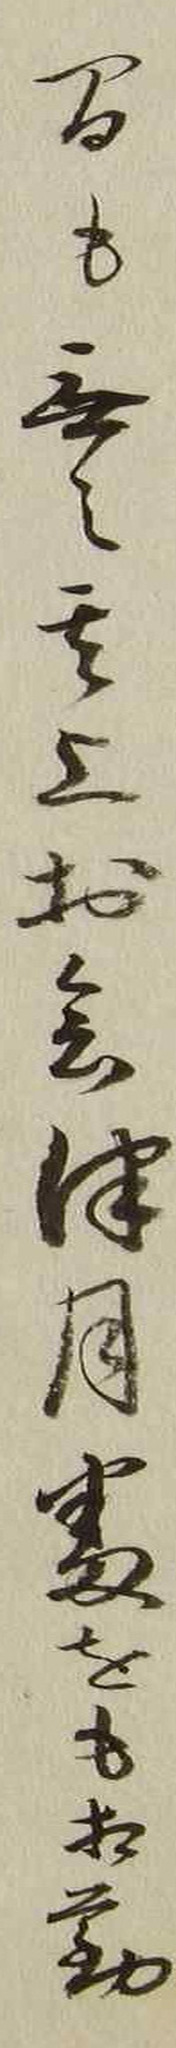間も無之其上於会津月番をも相勤
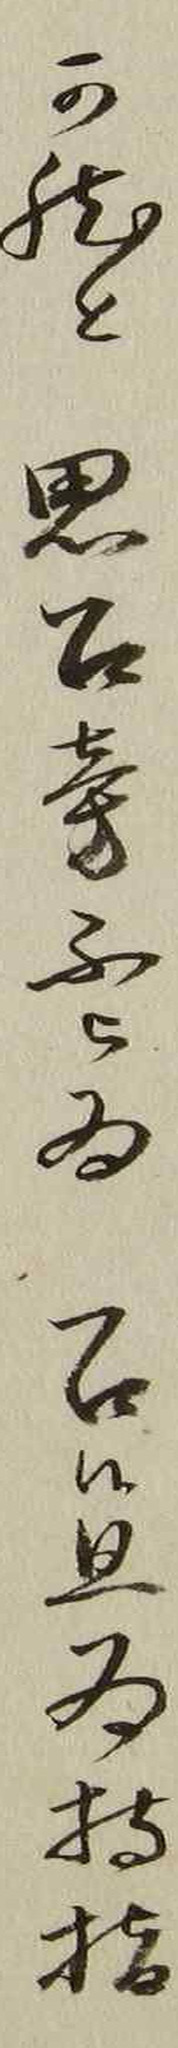可然と思召旁不被為召候且為持指
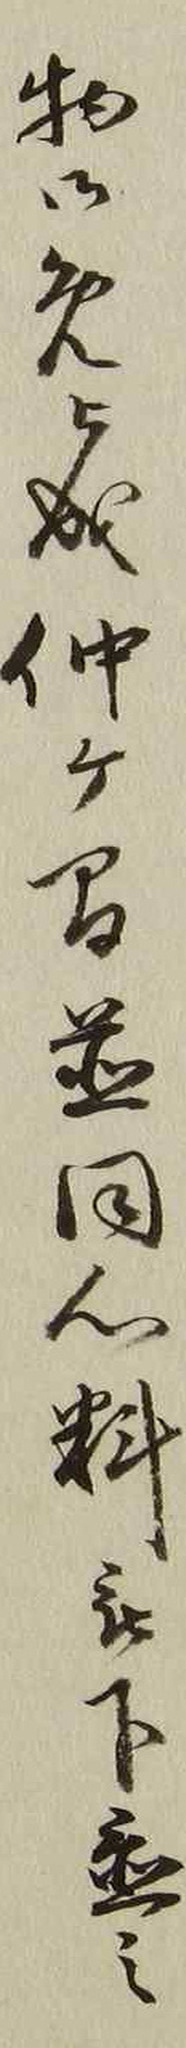物御免成仲け間並同心料被下置之
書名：諸士系譜　巻之125　た之部1
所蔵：会津若松市立会津図書館
